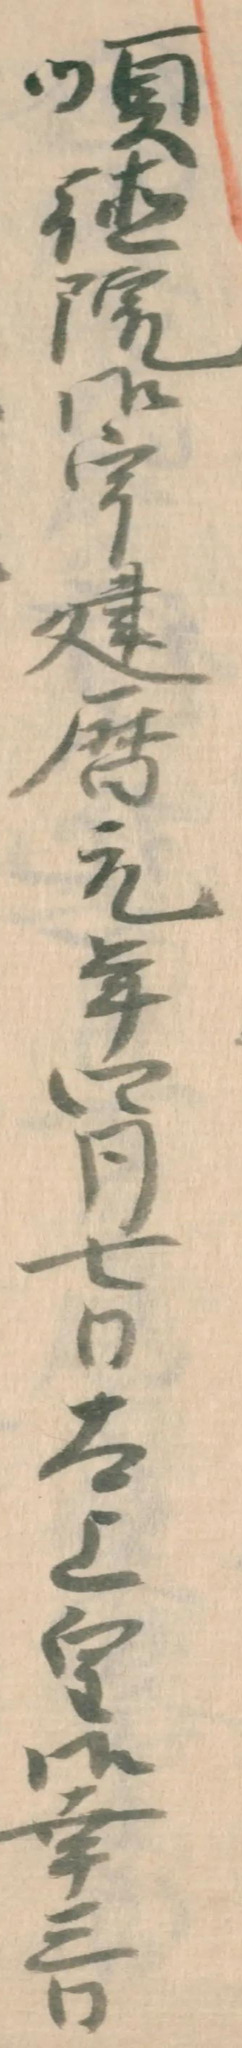順徳院御宇建暦元年四月七日太上皇御幸三日
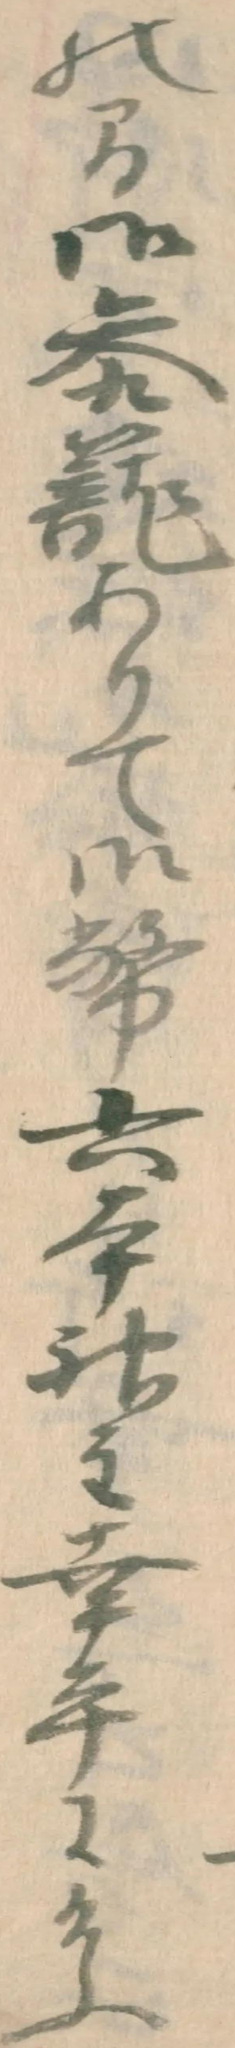の間御参籠ありて御幣六本神主幸平に給ふ
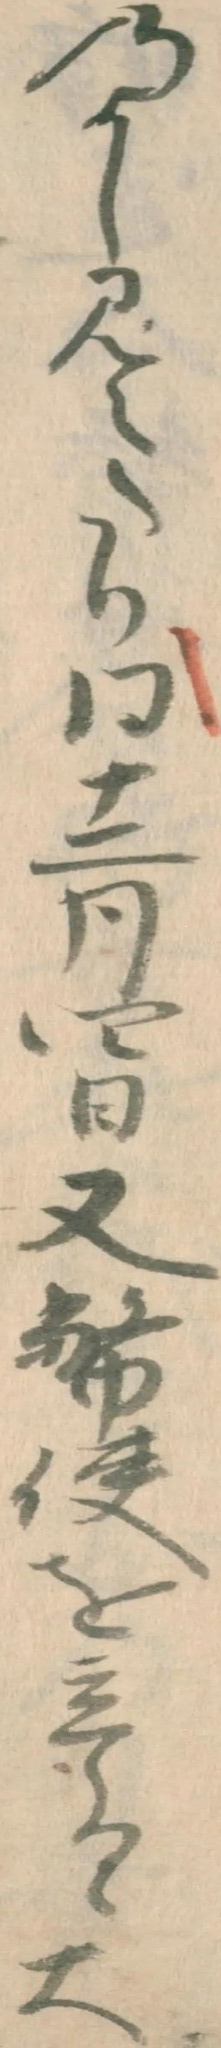のよし見えたり同十二月四日又幣使を立らるゝ大
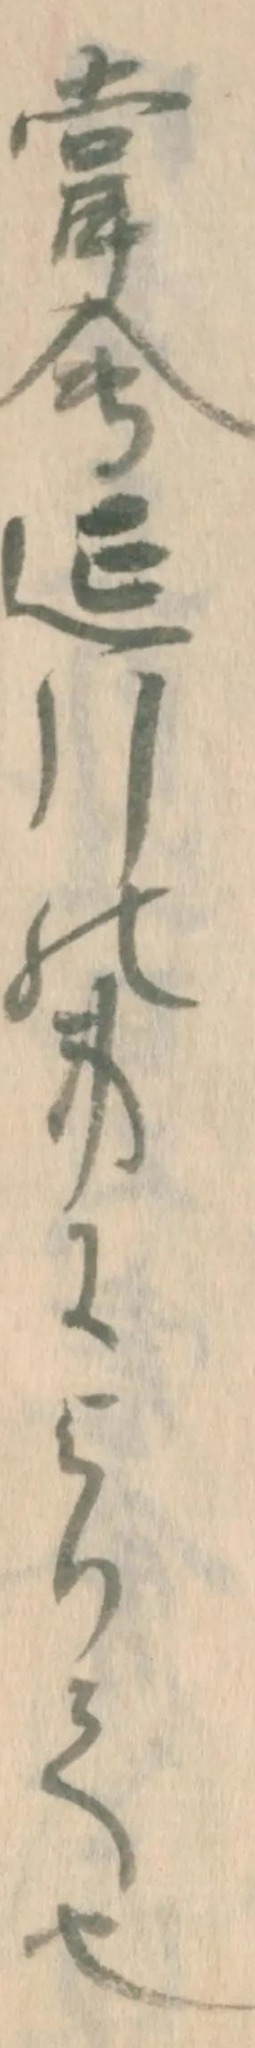嘗会延引の事によりて也
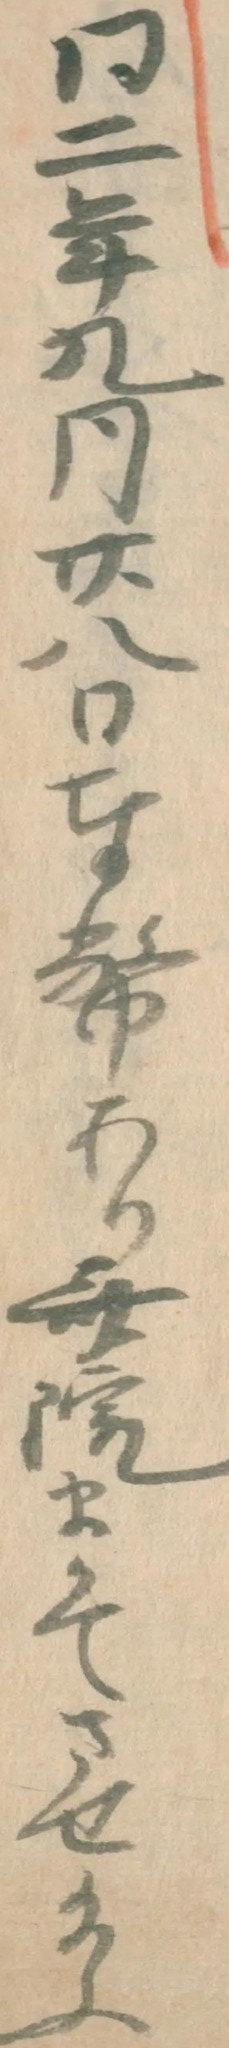同二年九月廿八日奉幣あり斎院まかてさせ給ふ

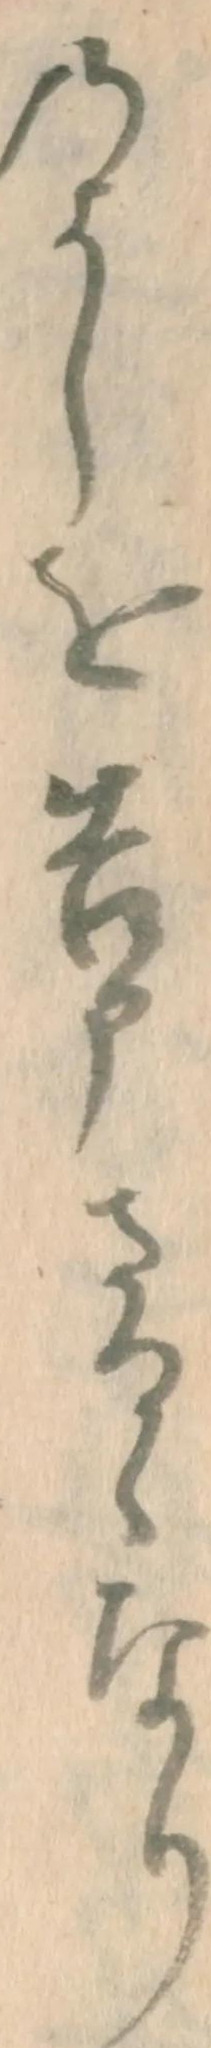のよしを告申さるゝなり
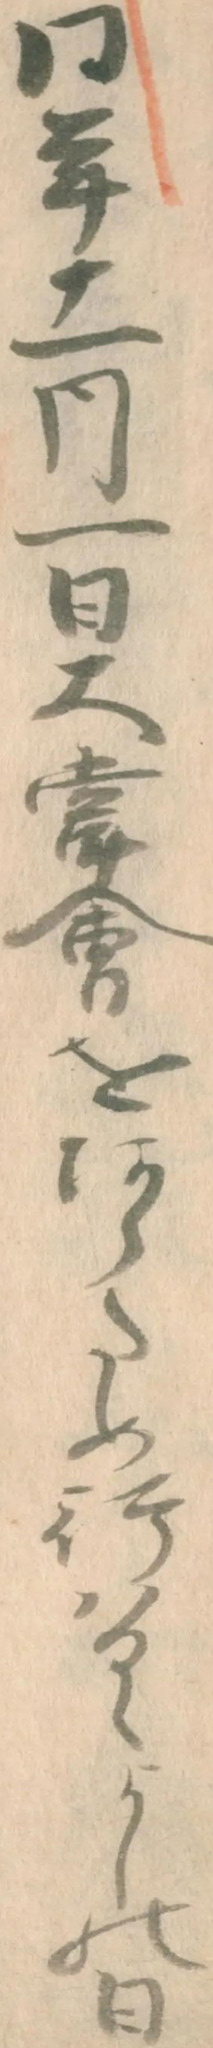同年十一月一日大嘗会をあらため行はるゝよしの日
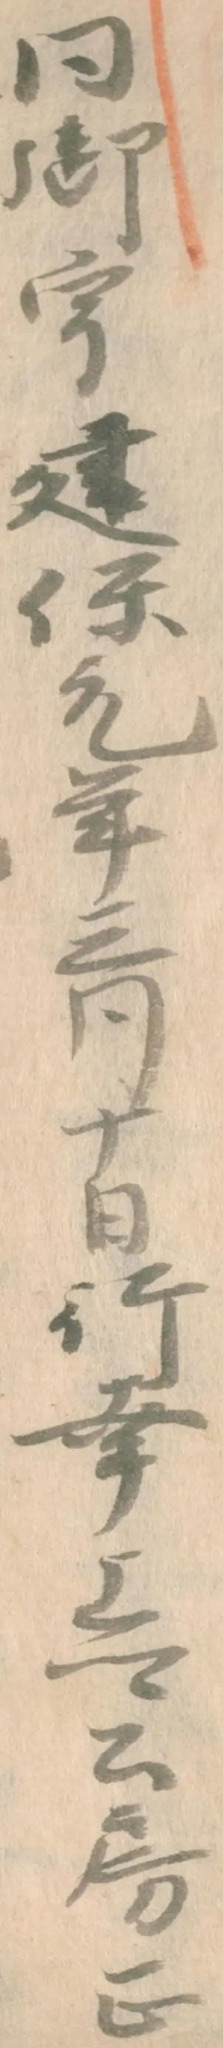同御宇建保元年三月十日行幸上卿公房正
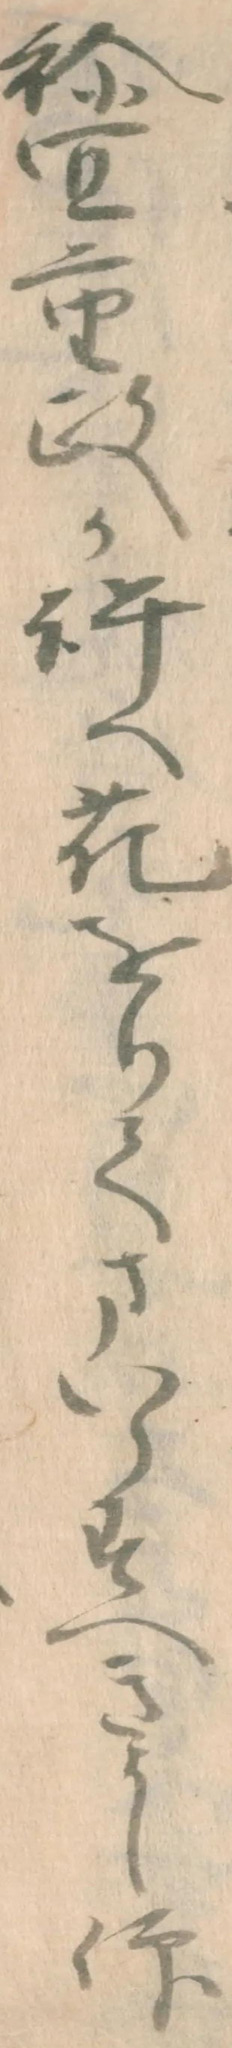弥宜重政か許へ花をりてまいらすへきよし仰
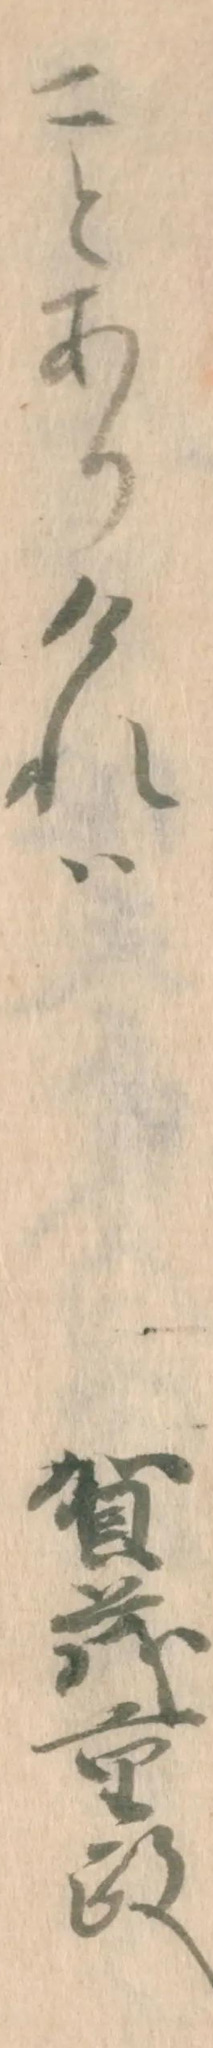ことありけれは賀茂重政
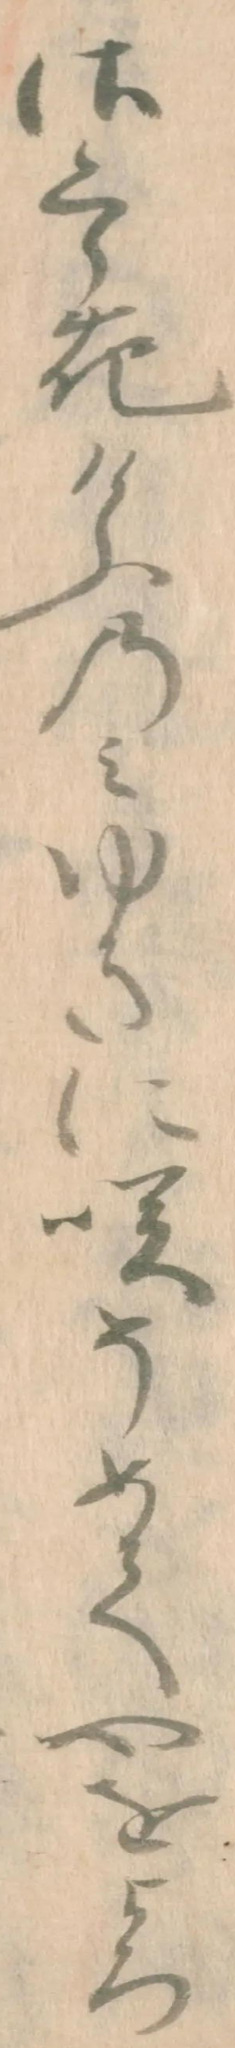さくら花けふのみゆきに咲そめてやをよろ
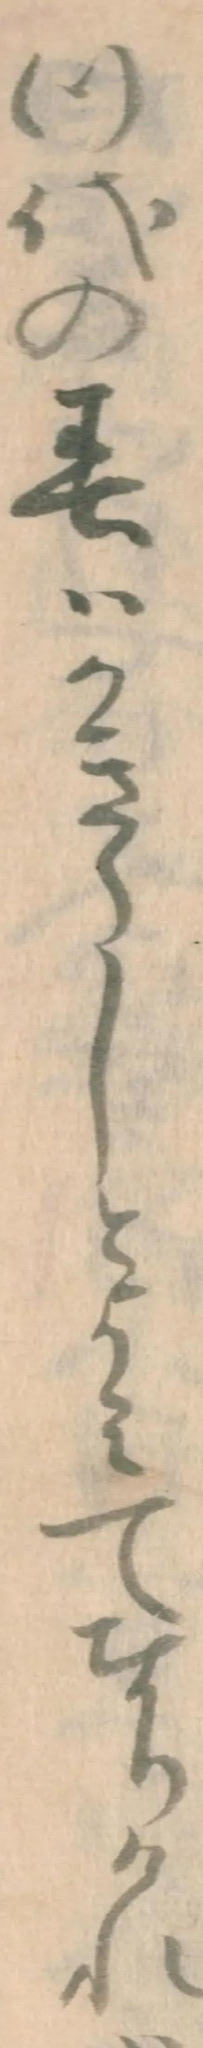つ代の春はかきらしとよみて奉りけれは
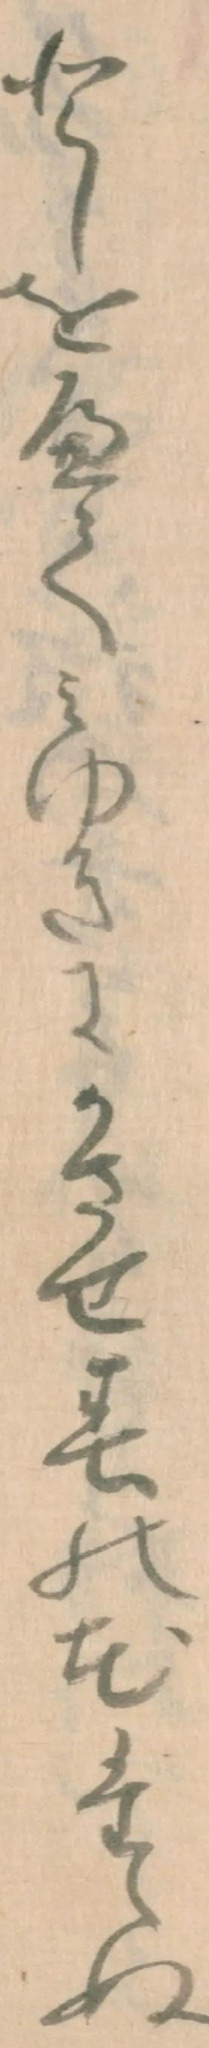としをへてみゆきにかさせ春の花たえぬ
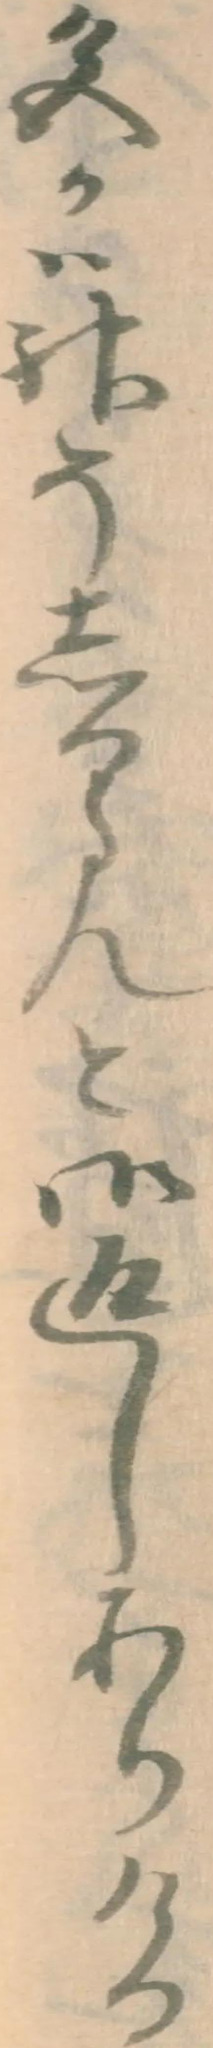色かは神そしるらんと御返しありける
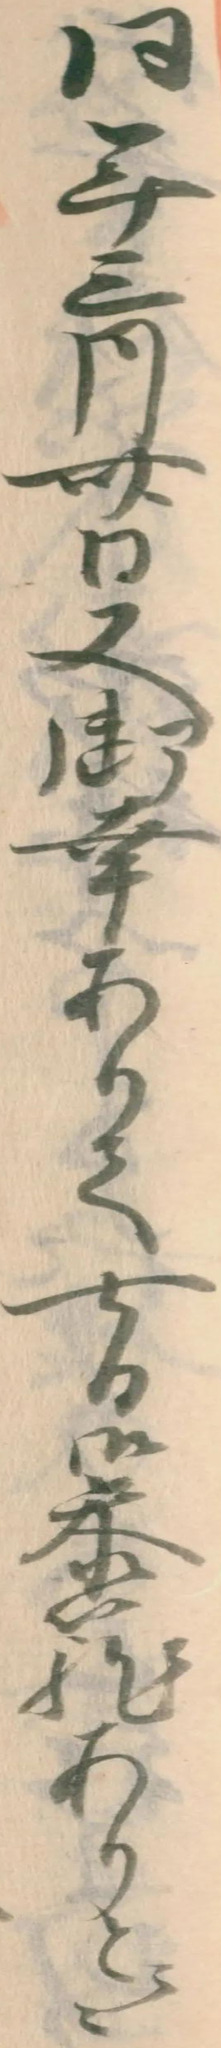同年三月卅日又御幸ありて七日御参籠ありと云〃
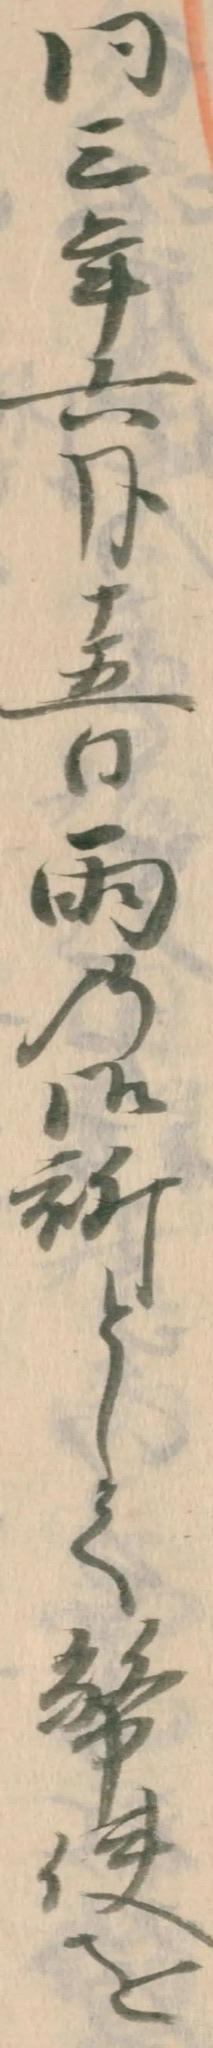同三年六月十五日雨の御祈として幣使を
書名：賀茂社記録. 第1冊
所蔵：国立国会図書館 National Diet Library, JAPAN
